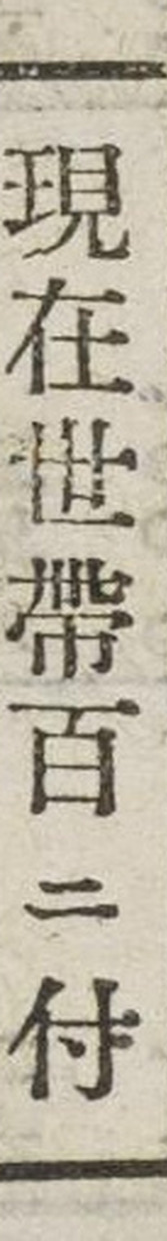現在世帯百ニ付
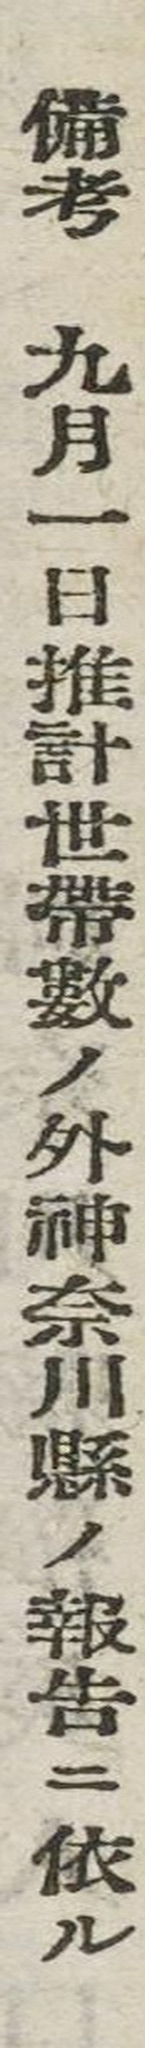備考九月一日推計世帯数ノ外神奈川県ノ報告ニ依ル
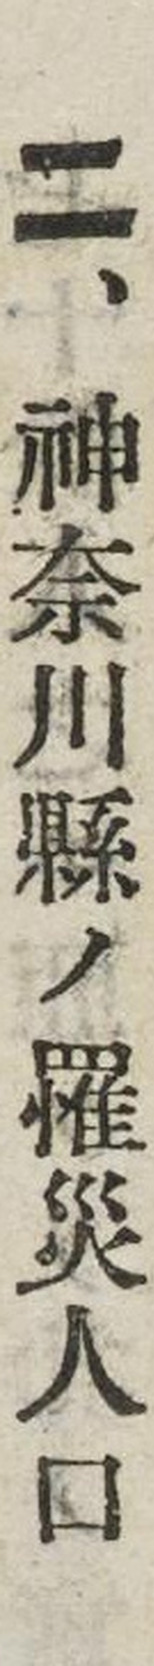ニ、神奈川県ノ罹災人口
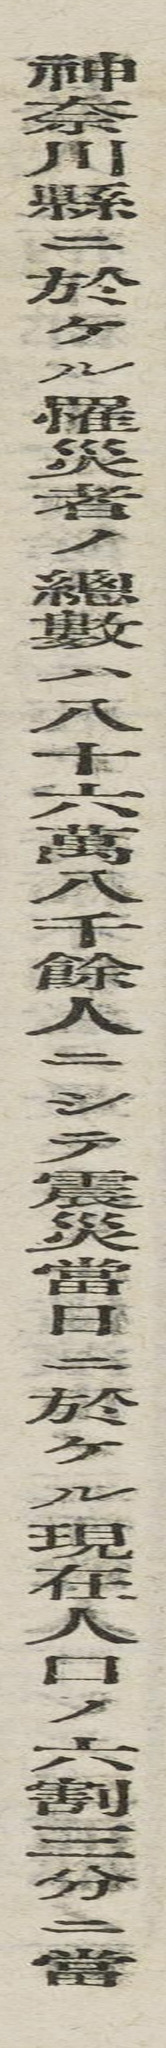神奈川県ニ於ケル罹災者ノ総数ハ八十六万八千余人ニシテ震災当日ニ於ケル現在人口ノ六割三分ニ当
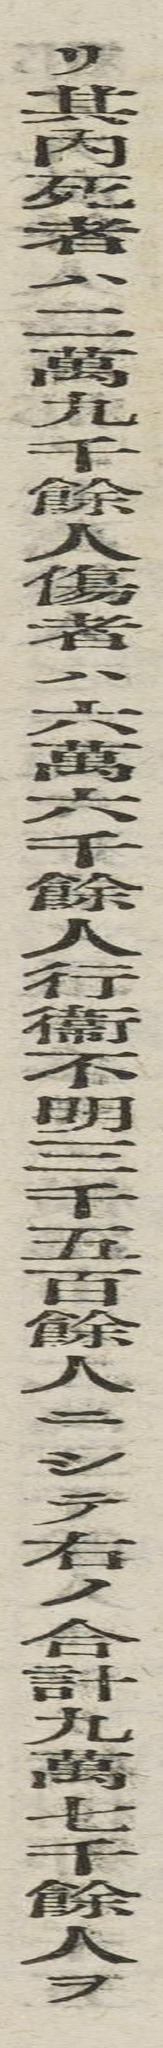リ其内死者ハ二万九千余人傷者ハ六万六千余人行方不明三千五百余人ニシテ右ノ合計九万七千余人ヲ
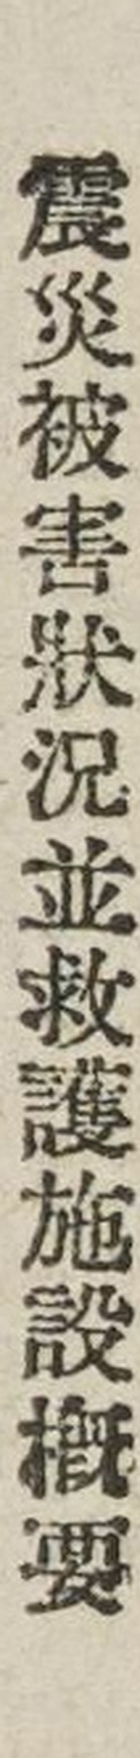震災被害状況並救護施設概要

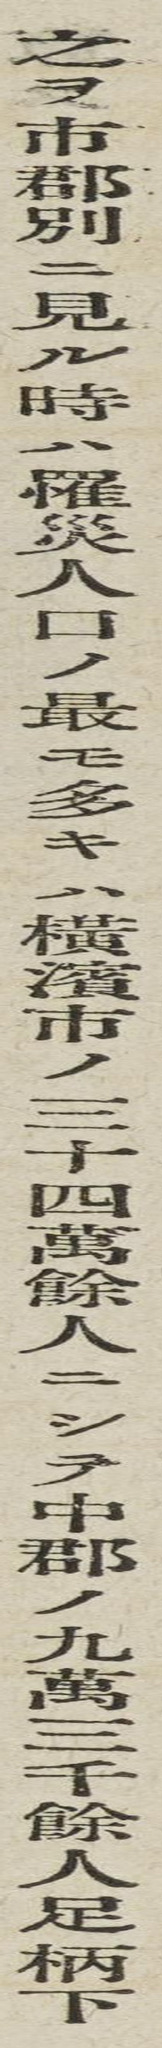之ヲ市郡別ニ見ル時ハ罹災人口ノ最モ多キハ横浜市ノ三十四万余人ニシテ中郡ノ九万三千余人足柄下
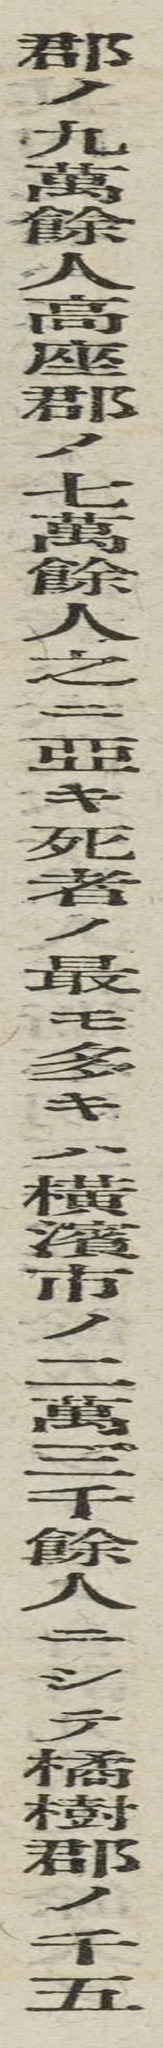郡ノ九万余人高座郡ノ七万余人之ニ亜キ死者ノ最モ多キハ横浜市ノ二万三千余人ニシテ橘樹郡ノ千五
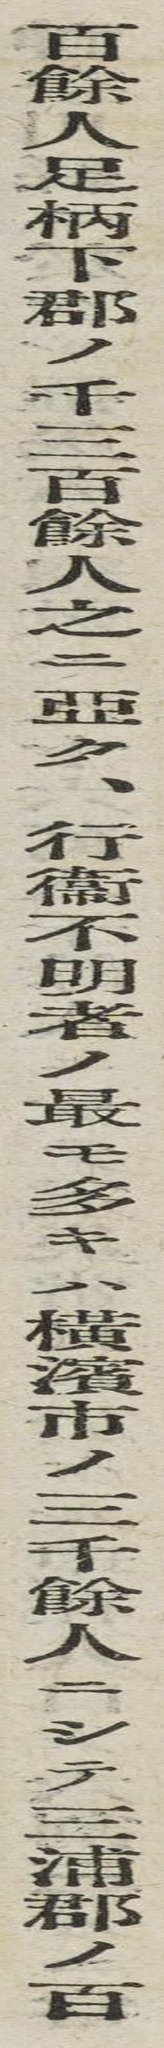百余人足柄下郡ノ千三百余人之ニ亜ク、行方不明者ノ最モ多キハ横浜市ノ三千余人ニシテ三浦郡ノ百
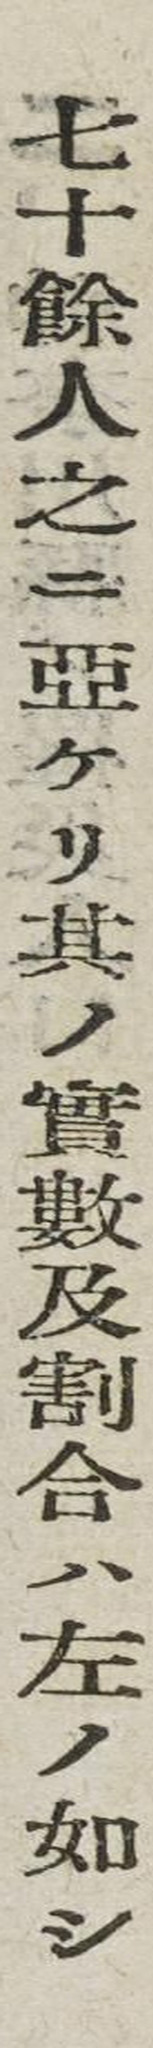七十余人之ニ亜ケリ其ノ実数及割合ハ左ノ如シ
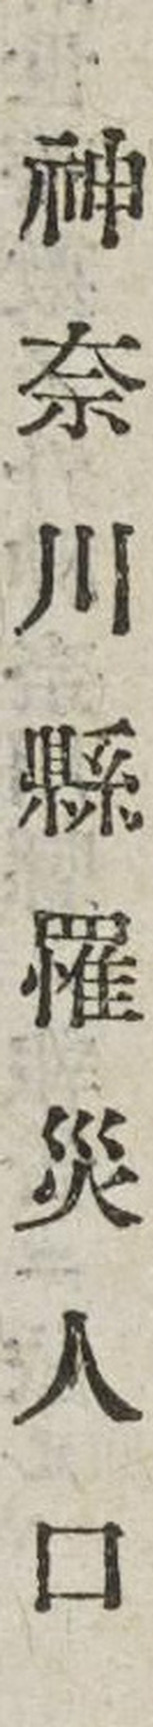神奈川県罹災人口
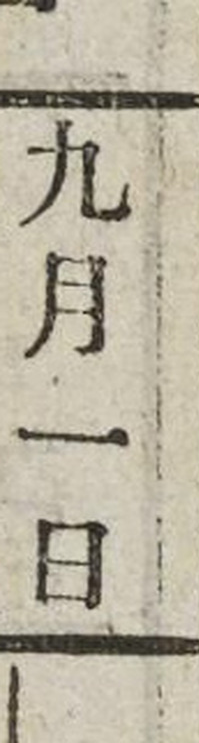九月一日
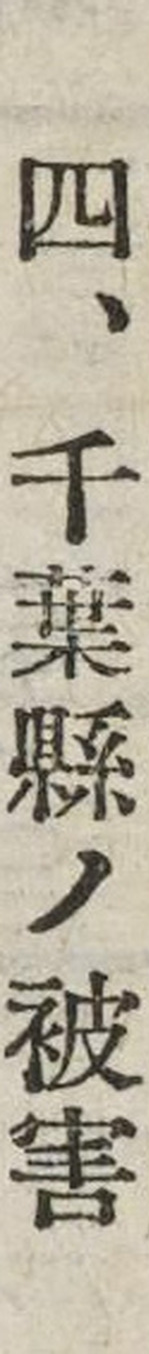四、千葉県ノ被害
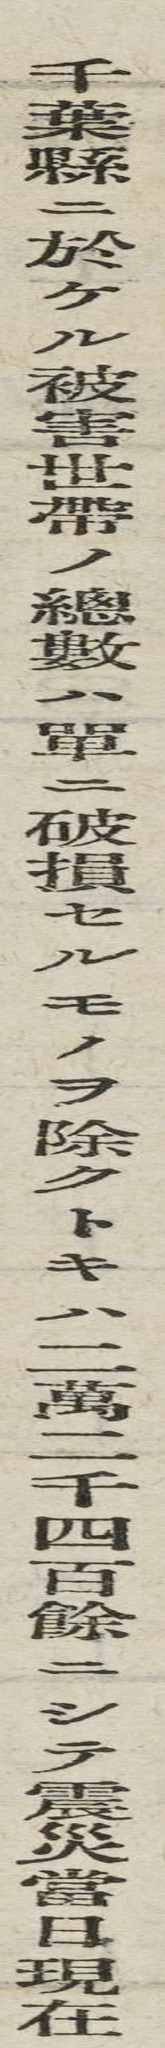千葉県ニ於ケル被害世帯ノ総数ハ単ニ破損セルモノヲ除クトキハ二万二千四百余ニシテ震災当日現在
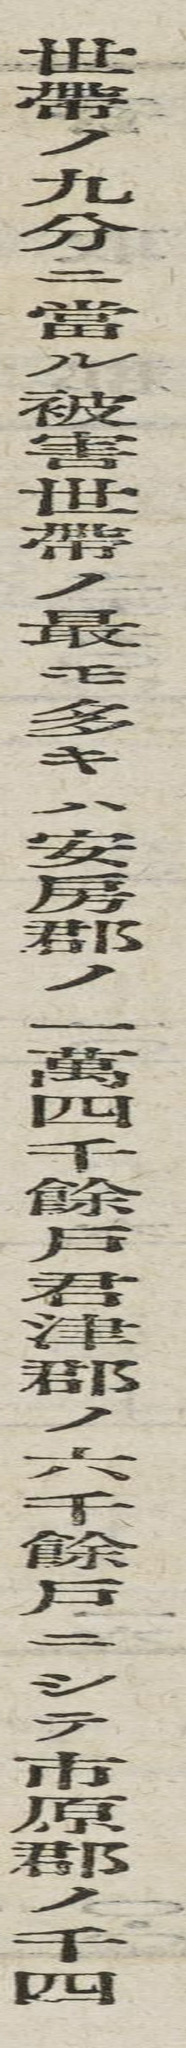世帯ノ九分ニ当ル被害世帯ノ最モ多キハ安房郡ノ一万四千余戸君津郡ノ六千余戸ニシテ市原郡ノ千四
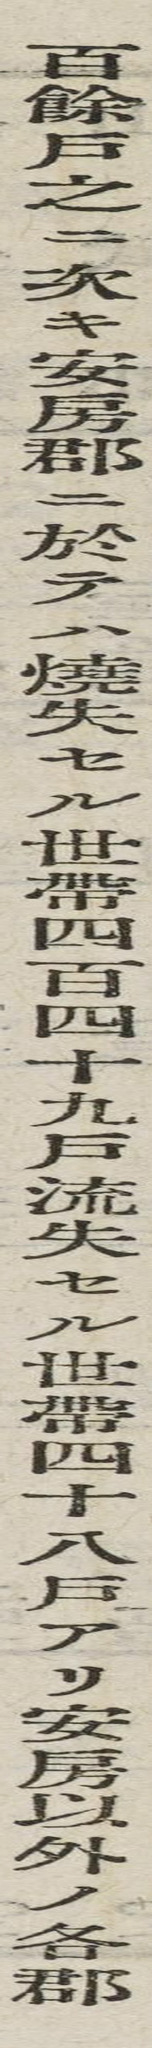百余戸之ニ次キ安房郡ニ於テハ焼失セル世帯四百四十九戸流失セル世帯四十八戸アリ安房以外ノ各郡
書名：震災被害状況並救護施設概要
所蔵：東京大学地震研究所図書室 Earthquake Research Institute Library, The University of Tokyo, JAPAN
